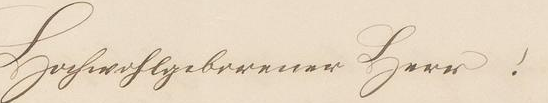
Hochwohlgeborener Herr!
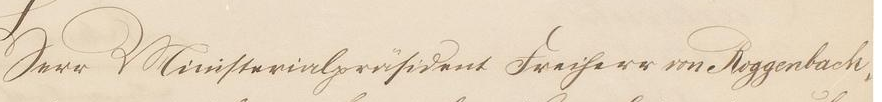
Herr Ministerialpräsident Freiherr von Roggenbach,
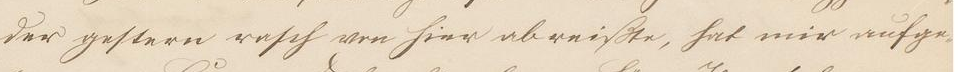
der gestern rasch von hier abreißte, hat mir aufge-
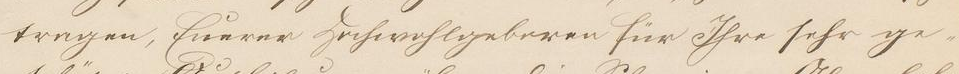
tragen, Eurer Hochwohlgeboren für Ihre sehr ge-
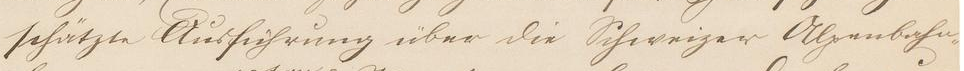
schätzte Ausführung über die Schweizer Alpenbahn-
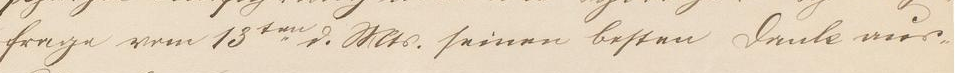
frage vom 13ten d. Mts. seinen besten Dank aus-
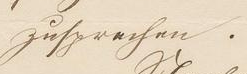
zusprechen.
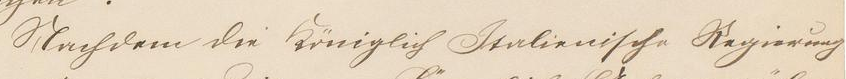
Nachdem die Königlich Italienische Regierung
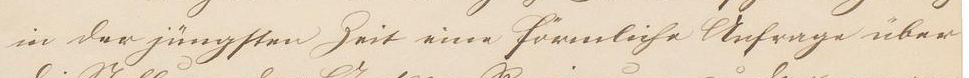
in der jüngsten Zeit eine förmliche Anfrage über
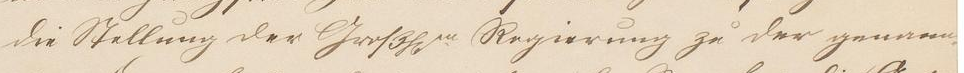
die Stellung der Großhen Regierung zu der genann-
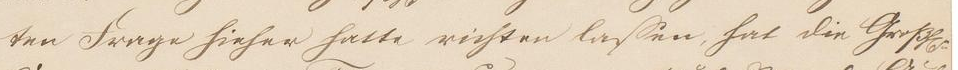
ten Frage hieher hatte richten laßen, hat die Großh.
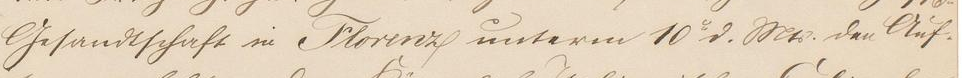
Gesandtschaft in Florenz unterm 10 d. Mts. den Auf-
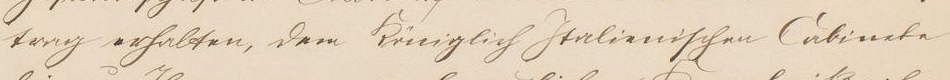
trag erhalten, dem Königlich Italienischen Cabinete
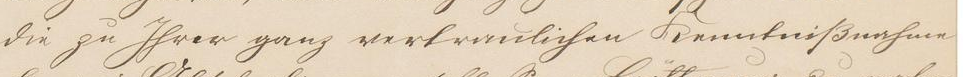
die zu Ihrer ganz vertraulichen Kenntnißnahme
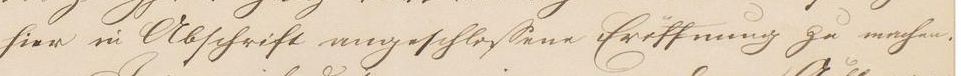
hier in Abschrift angeschlossene Eröffnung zu machen.
